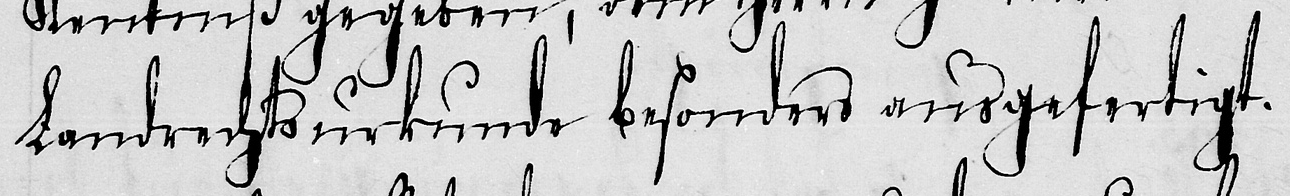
Landrechtsurkunde besonders ausgefertigt.
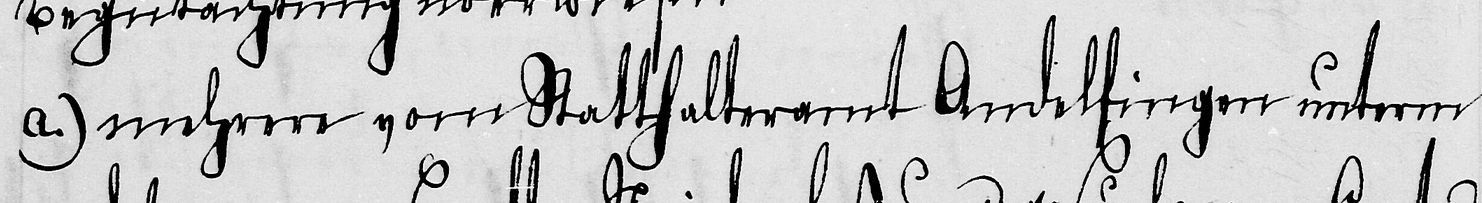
a.) mehrere vom Statthalteramt Andelfingen unterm
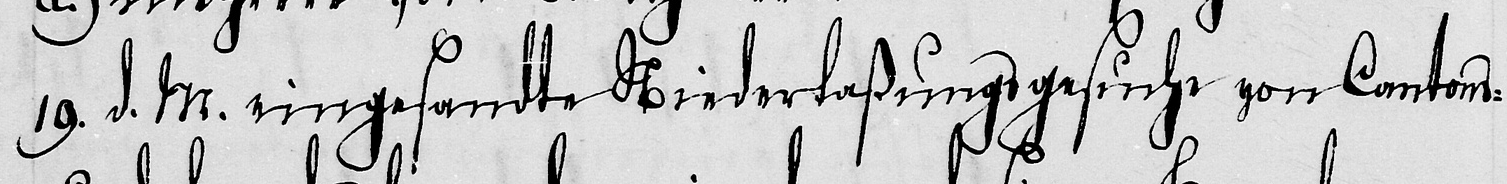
19. d. M. eingesandte Niederlaßungsgesuche von Cantons
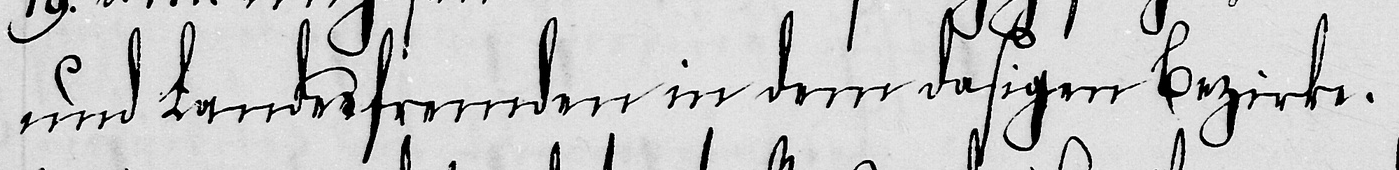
und Landesfremden in dem dasigen Bezirke.
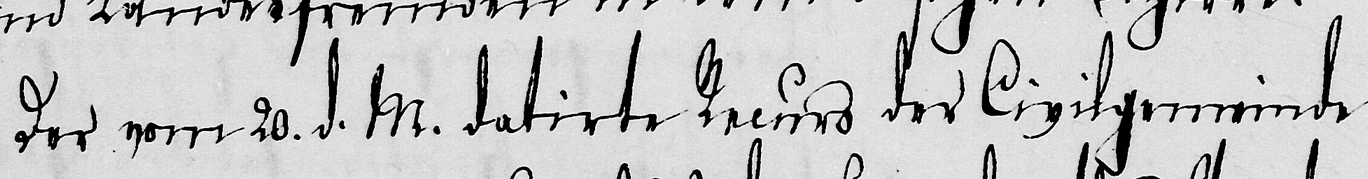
Der vom 20. d. M. datirte Recurs der Civilgemeinde
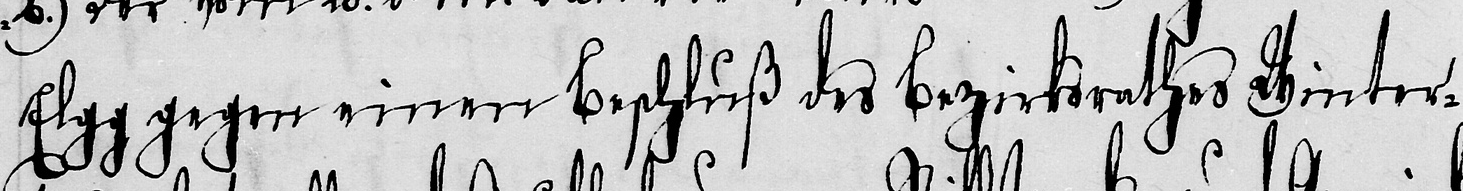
Elgg gegen einen Beschluß des Bezirksrathes Winter¬
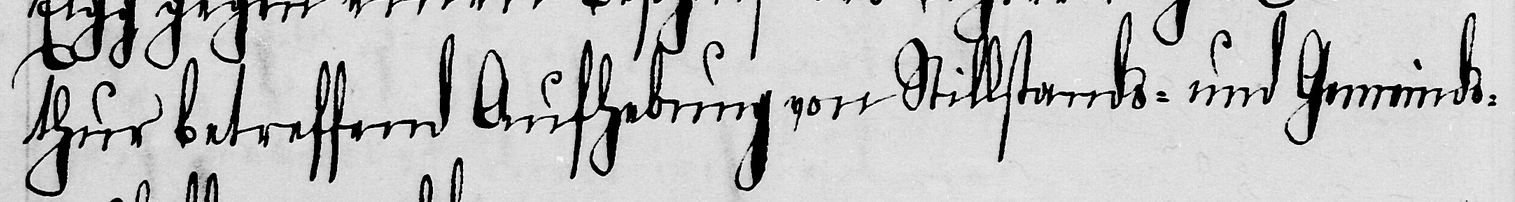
thur betreffend Aufhebung von Stillstands- und Gemeinds¬
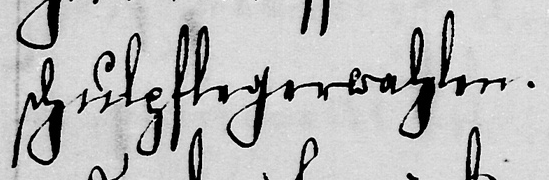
schulpflegewahlen.
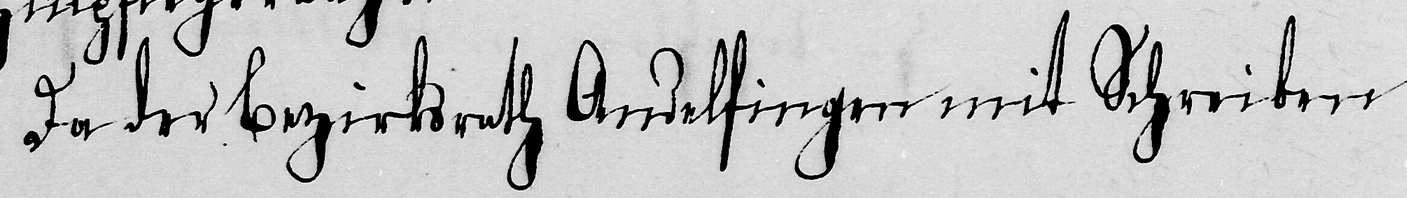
Da der Bezirksrath Andelfingen mit Schreiben
